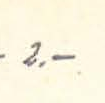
2
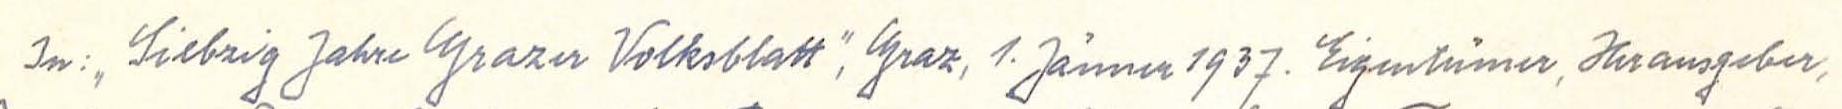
In: "Siebzig Jahre Grazer Volksblatt", Graz, 1. Jänner 1937. Eigentümer, Herausgeber,
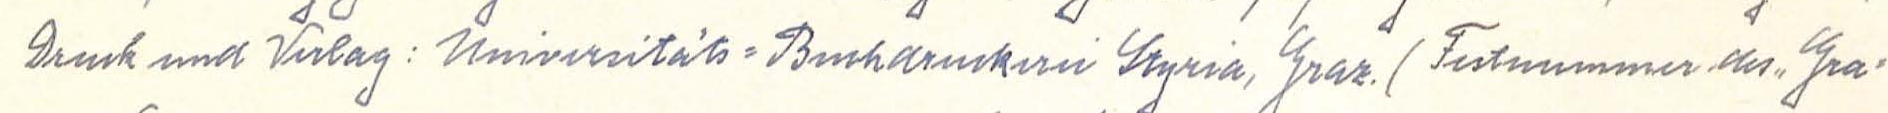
Druck und Verlag: Universitäts - Buchdruckerei Styria, Graz. (Festnummer des "Gra-
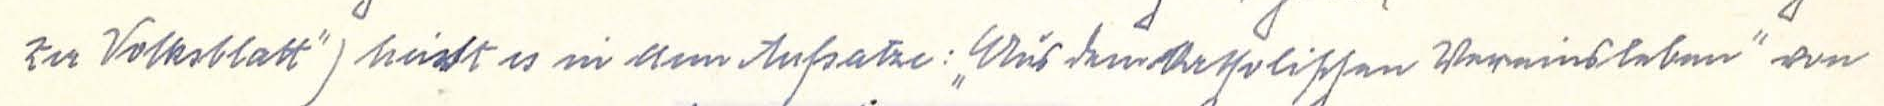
zer Volksblatt") heisst es in dem Aufsatze: "Aus dem katholischen Vereinslenem" von
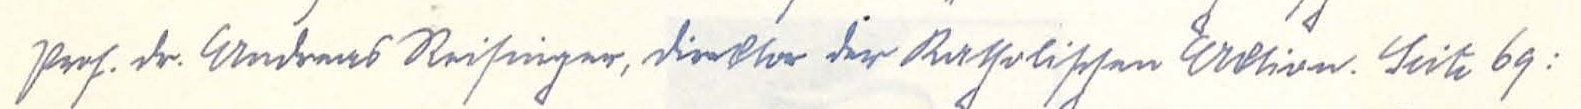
Prof. Dr. Andreas Reisinger, Direktor der Katholischen Aktion Seite 69:
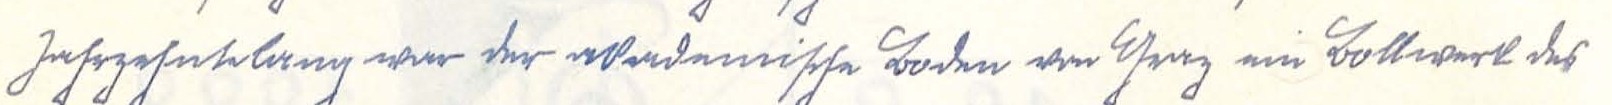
Jahrzehntelang war der akademische Boden in Graz ein Bollwerk des
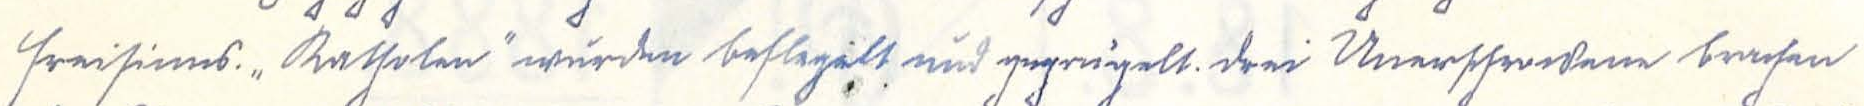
Freisinns. "Katholen" wurden beflegelt und geprügelt. drei Unerschrockene brachen
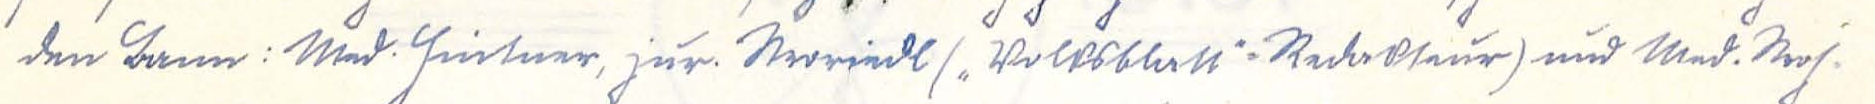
den Bann: Med. Hintner, jur. Stroriedl ( "Volksblatt"- Redakteur) und Med. Stroh
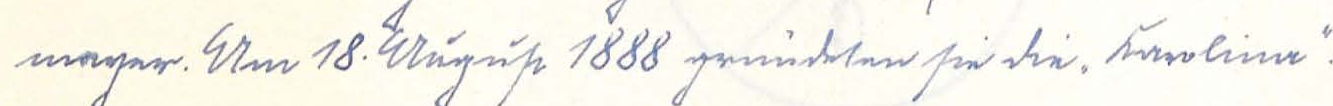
meyer. Am 18. August 1888 gründeten sie die "Carolina"
